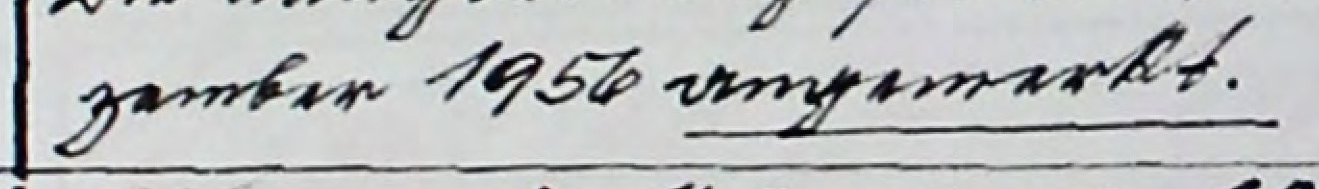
zember 1956 angemerkt.
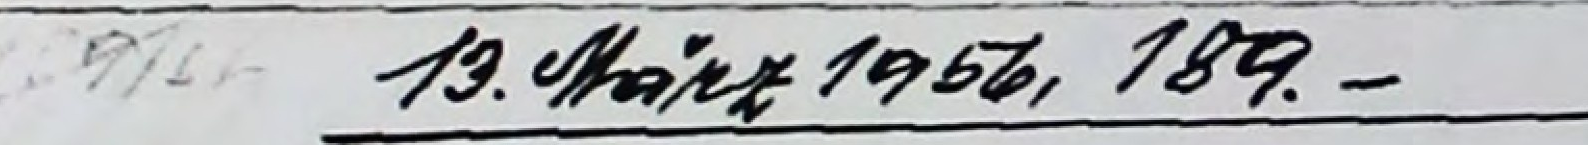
189/56 13. März 1956, 189.-
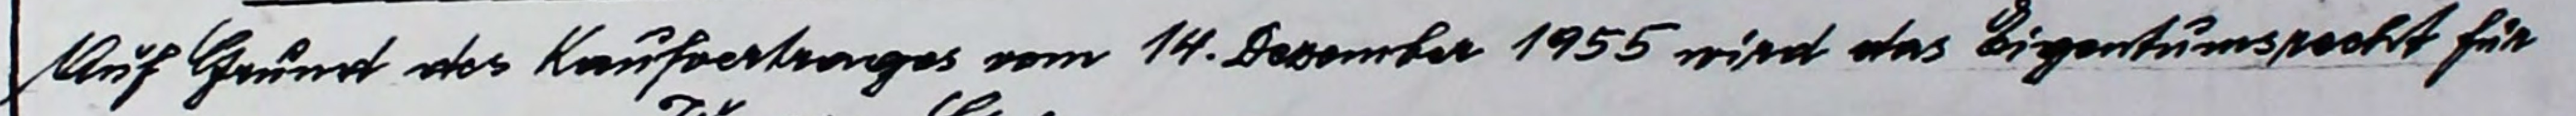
Auf Grund des Kaufvertrages vom 14. Dezember 1955 wird das Eigentumsrecht für
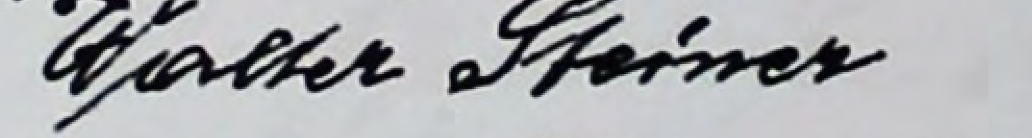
Walter Steiner
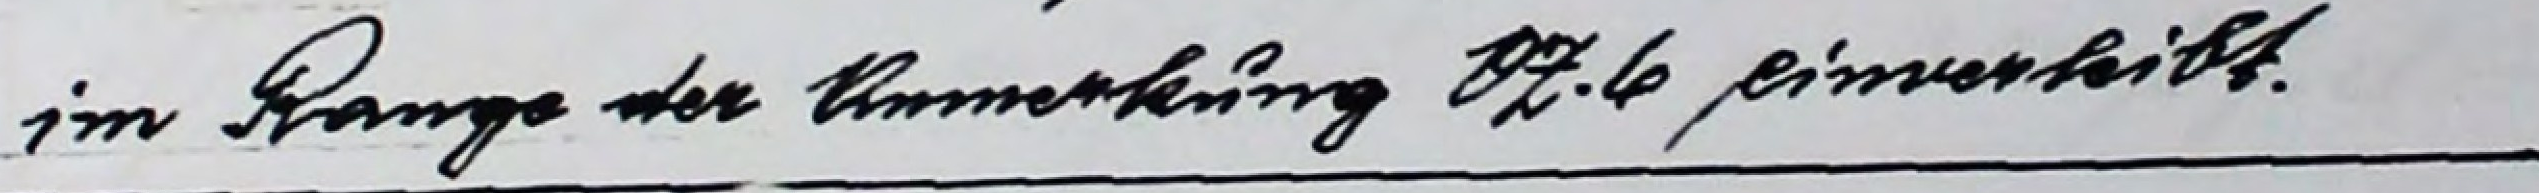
im Range der Anmerkung OZ. 6 einverleibt.
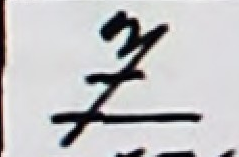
7
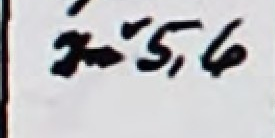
zu 5, 6
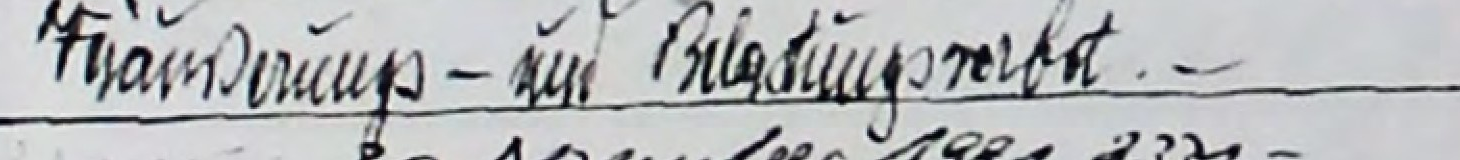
Veräußerungs- und Belastungsverbot.-
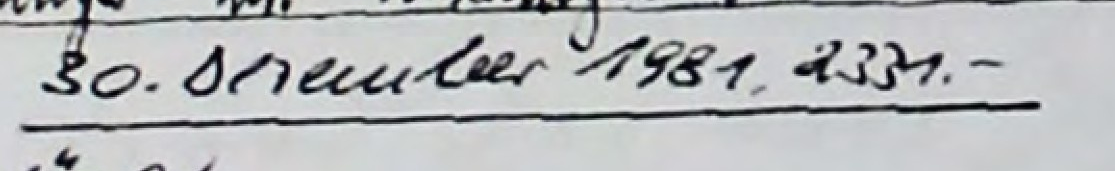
30. Dezember 1981, 2331.-
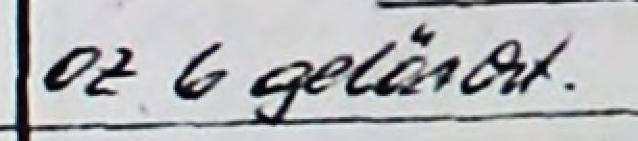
OZ 6 gelöscht.
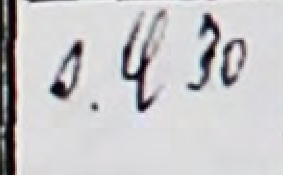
s C 30
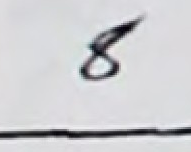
8
